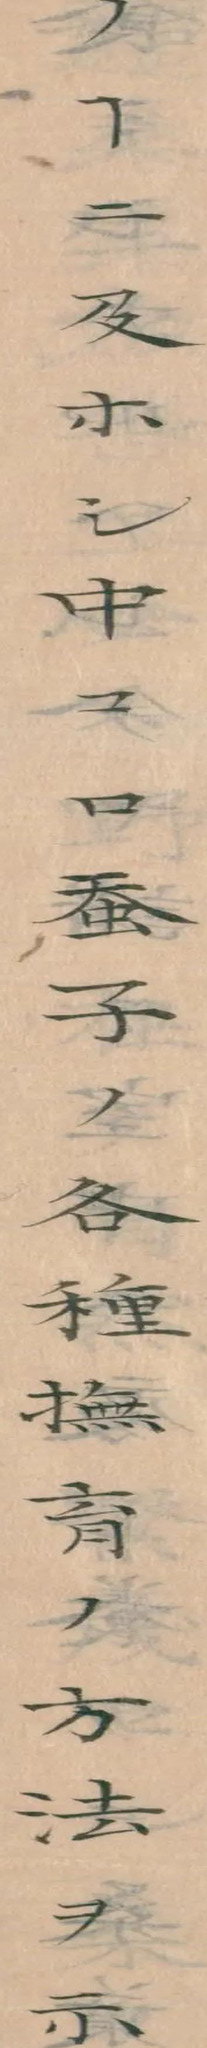ノコトニ及ホシ中コロ蚕子ノ各種撫育ノ方法ヲ示
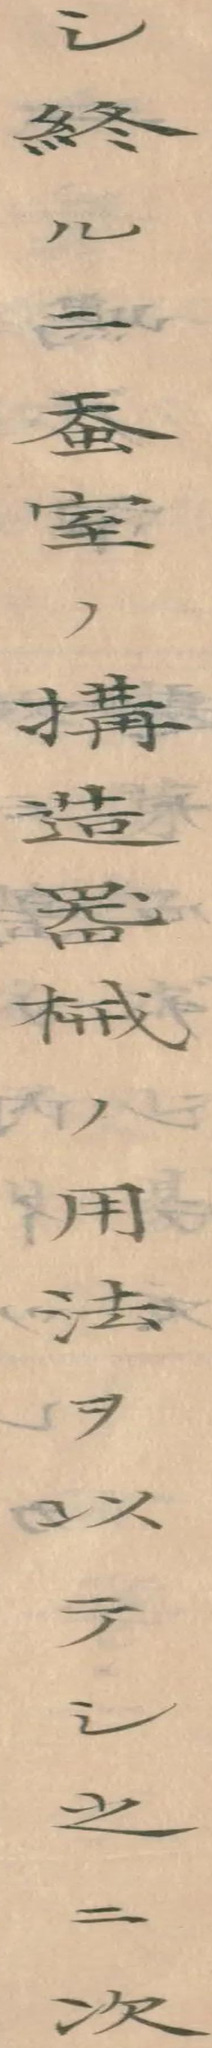シ終ルニ蚕室ノ搆造器械ノ用法ヲ以テシ之ニ次
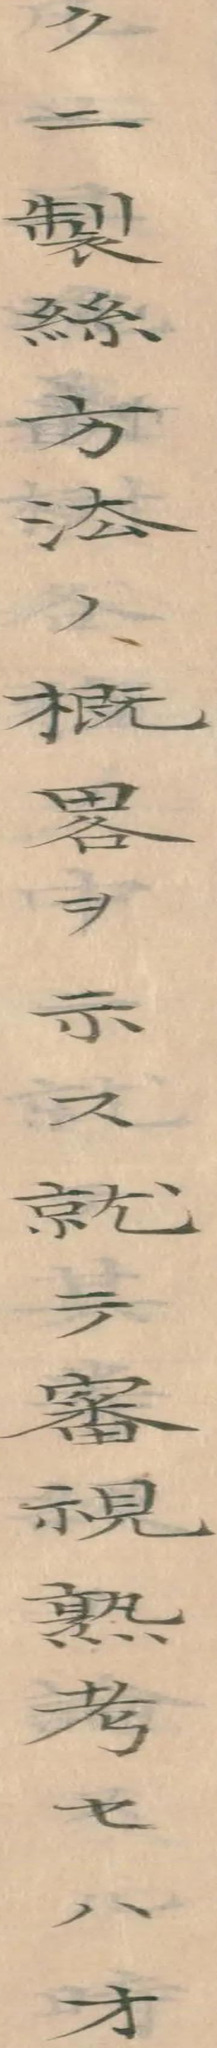クニ製糸方法ノ概略ヲ示ス就テ審視熟考セハオ
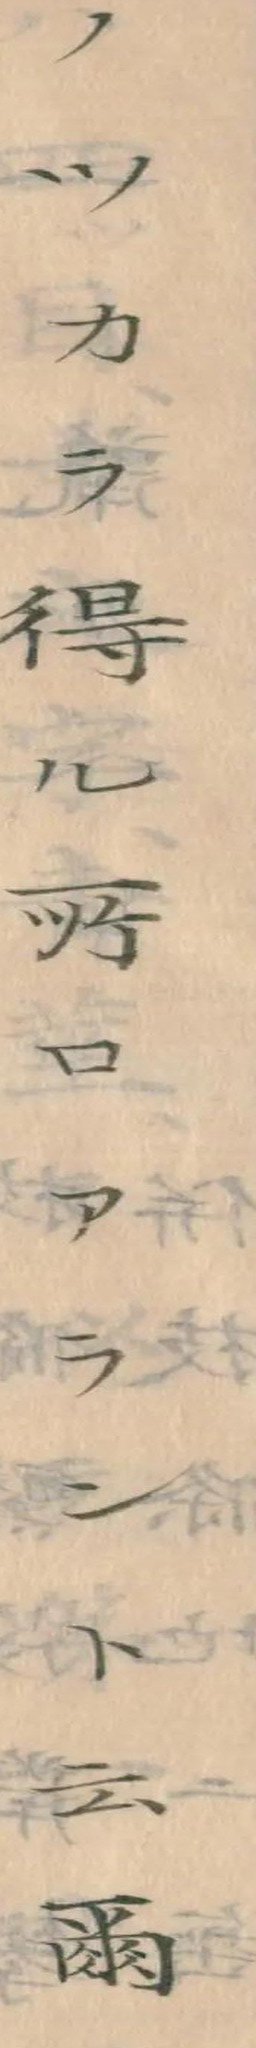ノツカラ得ル所ロアラント云爾
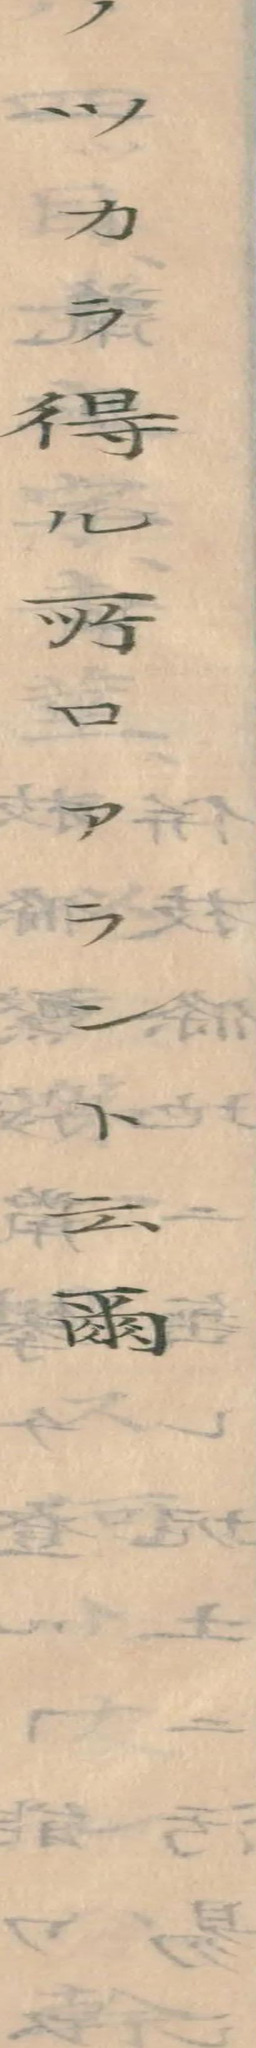ノツカラ得ル所ロアラント云爾
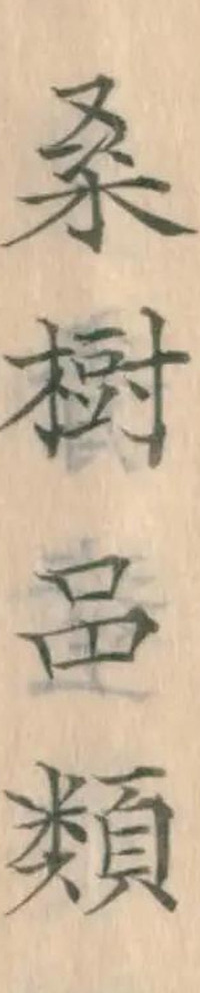桑樹品類
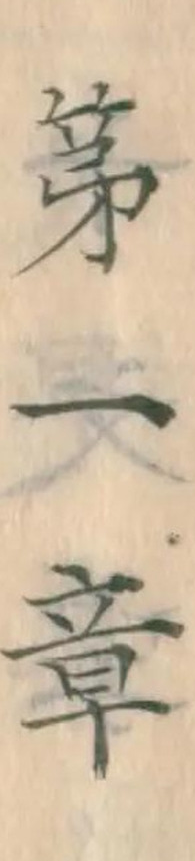第一章
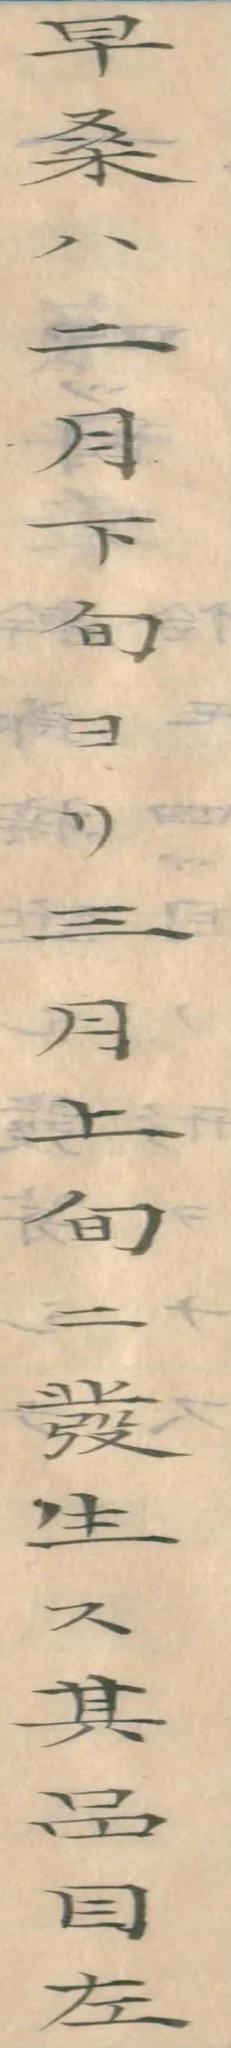早桑ハ二月下旬ヨリ三月上旬ニ発生ス其品目左
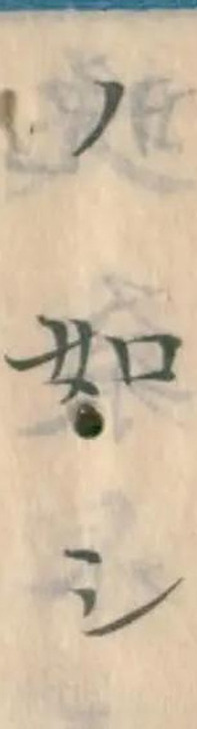ノ如シ
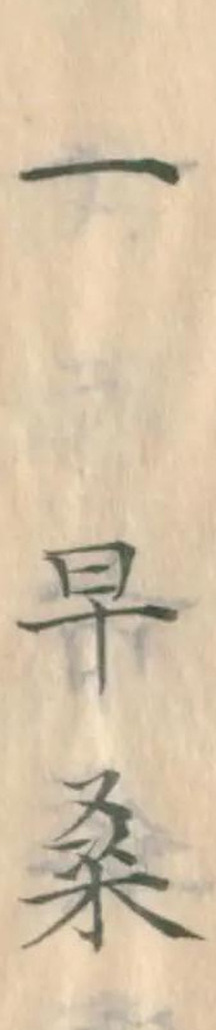一早桑

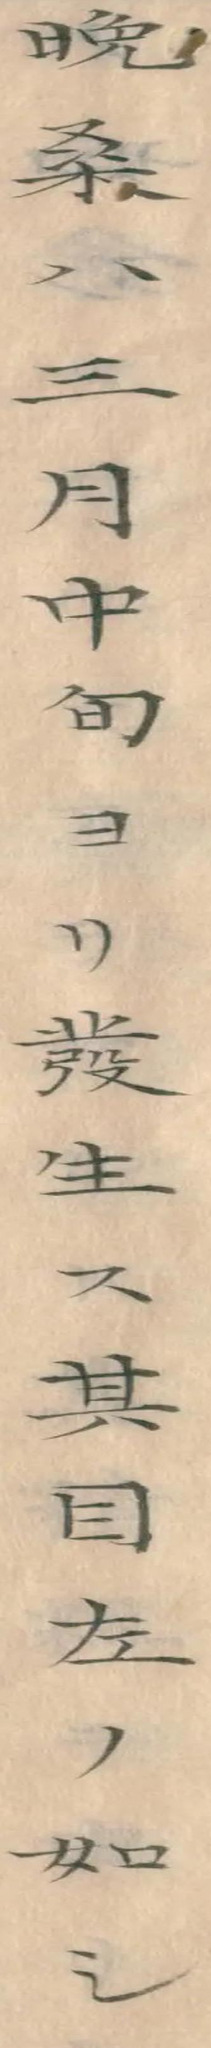晩桑ハ三月中旬ヨリ発生ス其目左ノ如シ
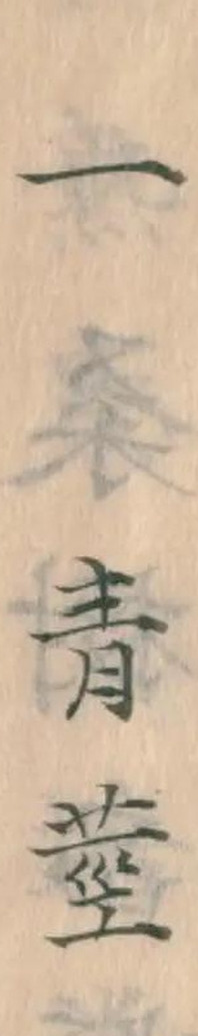一青茎
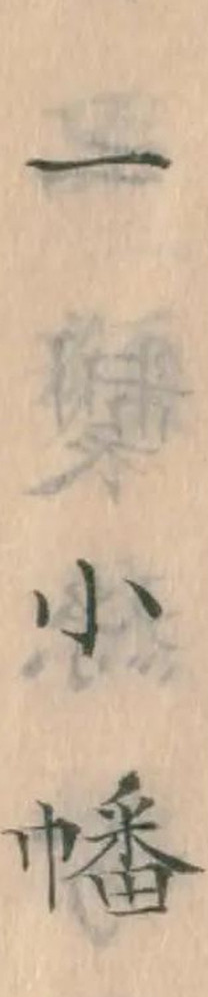一小幡
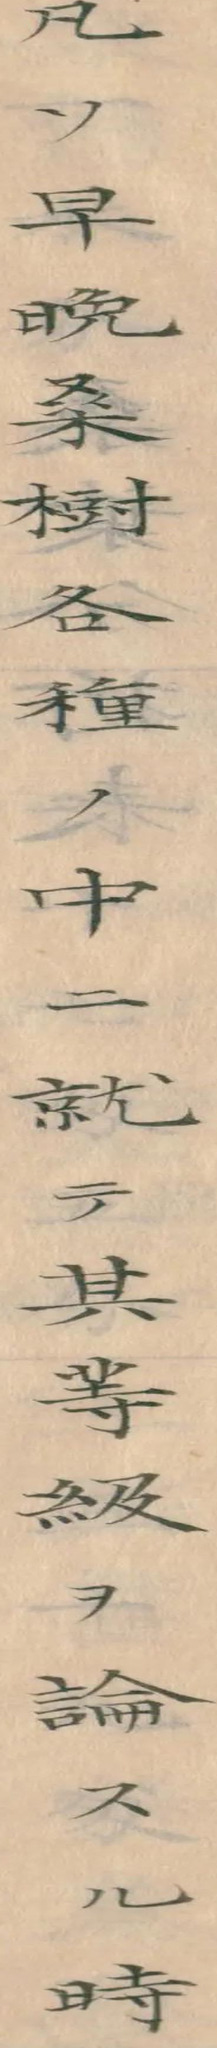凡ソ早晩桑樹各種ノ中ニ就テ其等級ヲ論スル時
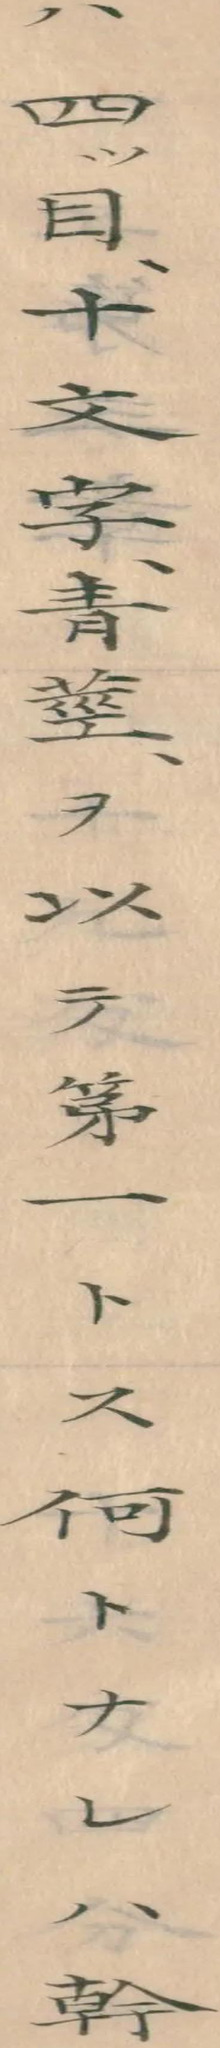ハ四ッ目、十文字、青茎、ヲ以テ第一トス何トナレハ幹
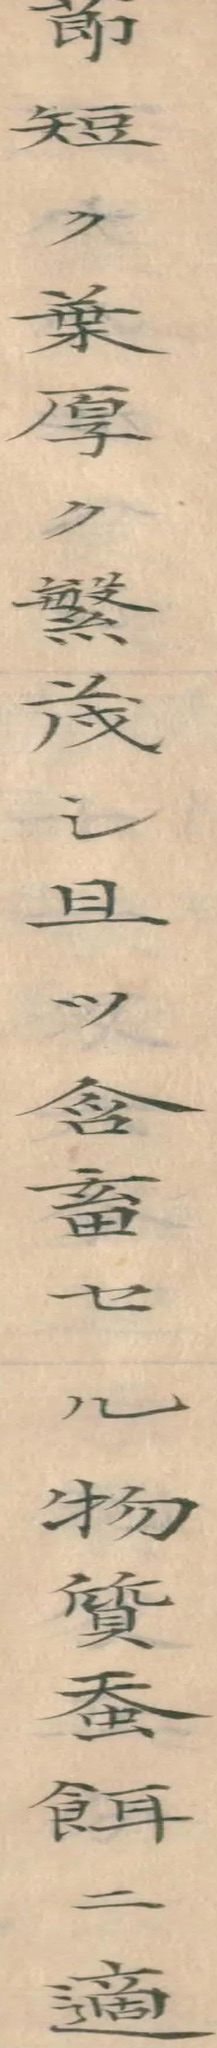節短ク葉厚ク繁茂シ且ツ含畜セル物質蚕餌ニ適
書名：蚕桑集成
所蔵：国立国会図書館 National Diet Library, JAPAN
